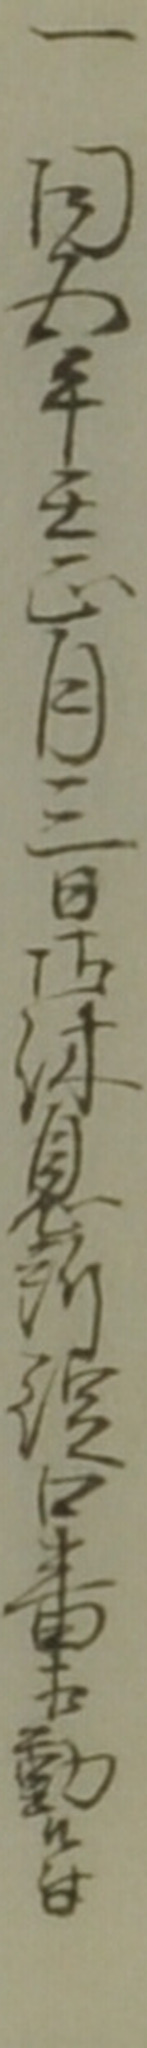一同五午閏正月三日御休息所錠口番相勤候付
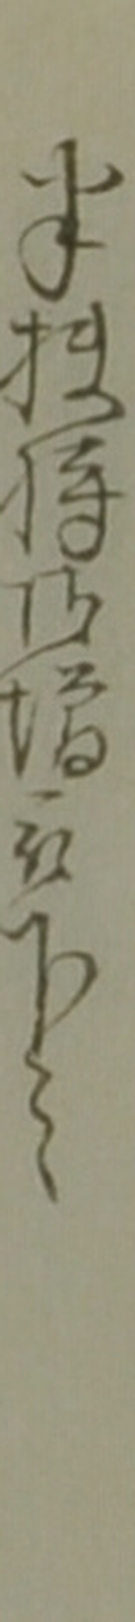半扶持御増被下之
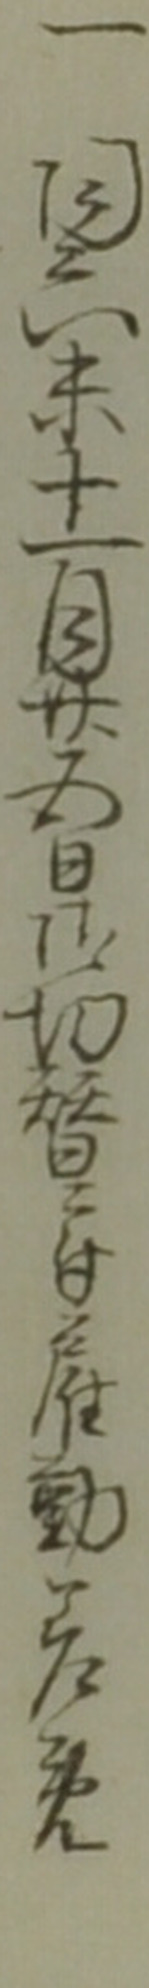一同六未十一月廿五日御切替ニ付雇勤差免
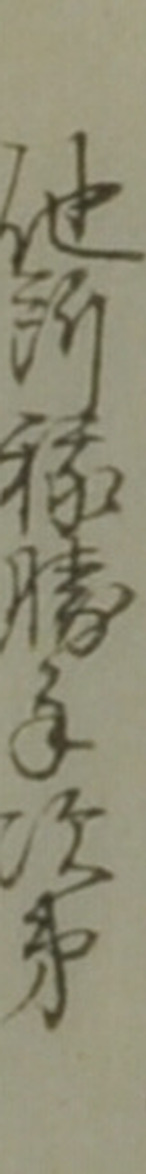他所稼勝手次第
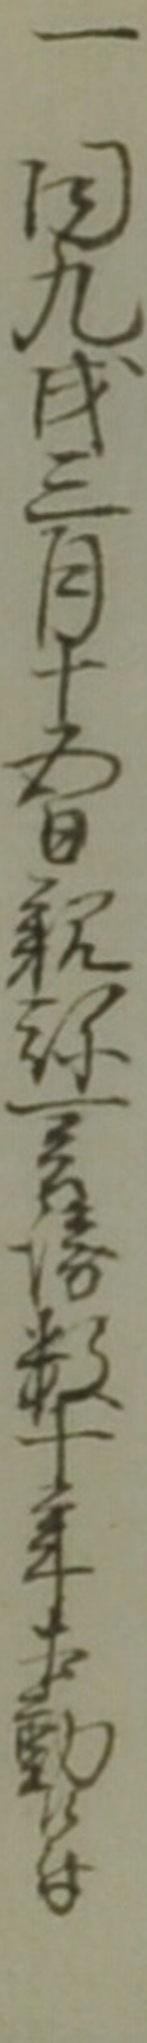一同九戌三月十五日親弥一兵衛数十年相勤候付
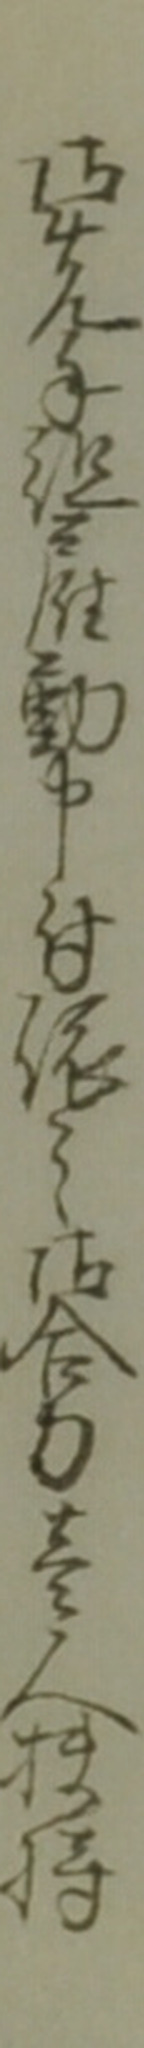御先手組雇勤申付依之御合力壱人扶持
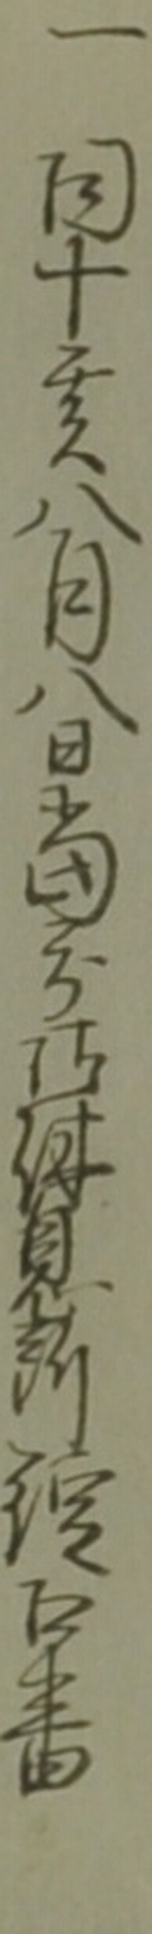一同十亥八月八日当分御休息所錠口番
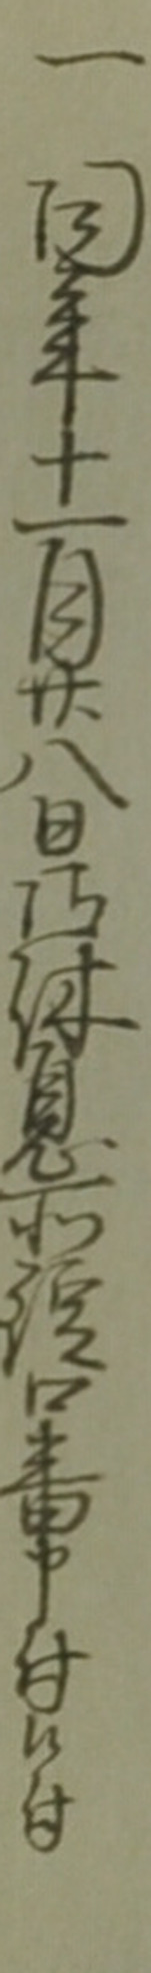一同年十一月廿八日御休息所錠口番申付候付
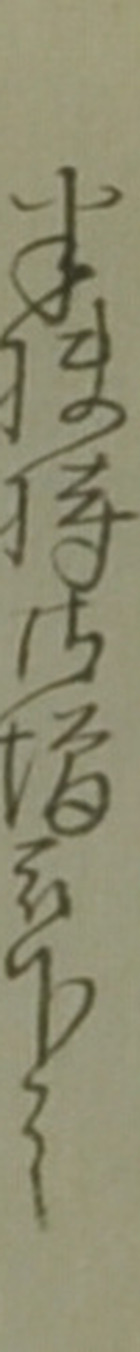半扶持御増被下之
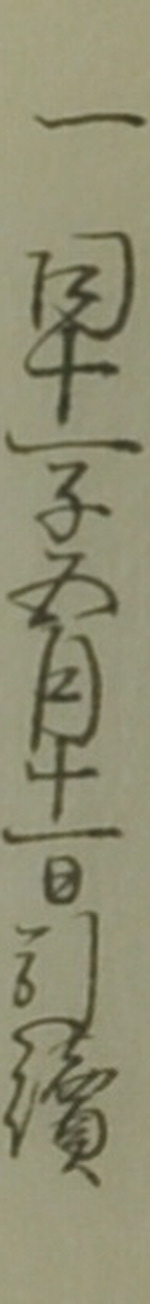一同十一子五月十一日引続
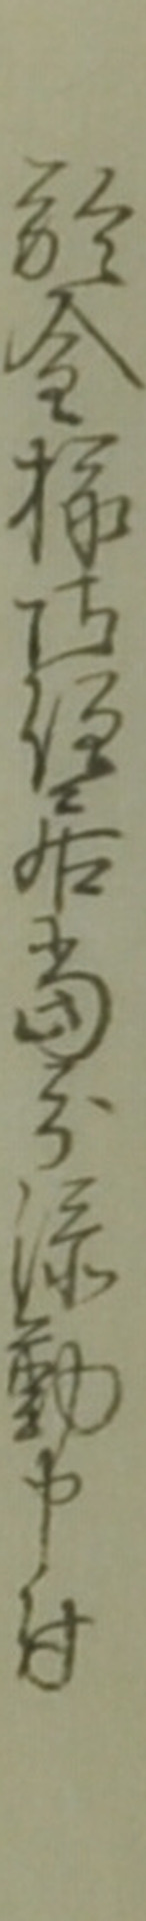於金様御住居当分添勤申付
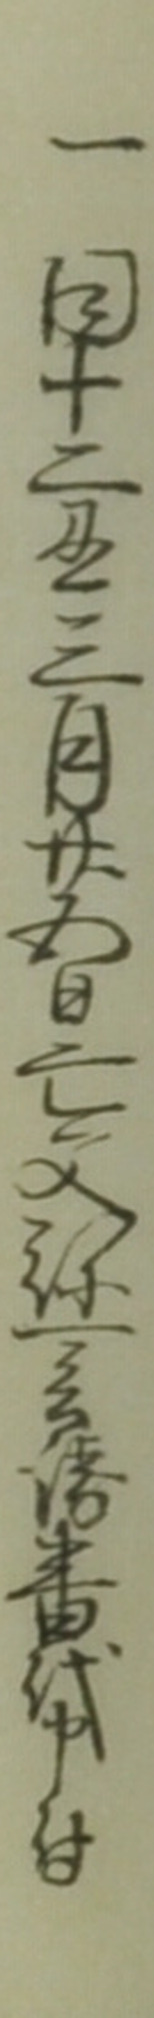一同十二丑三月廿五日亡父弥一兵衛番代申付

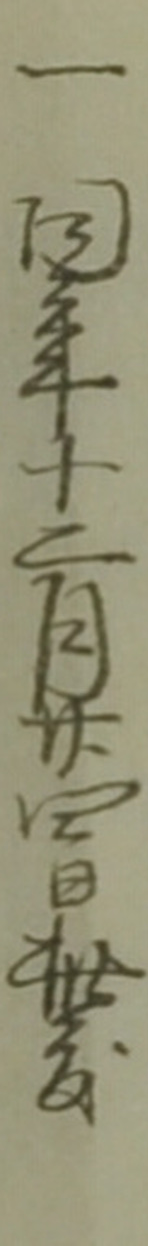一同年十二月廿四日此度
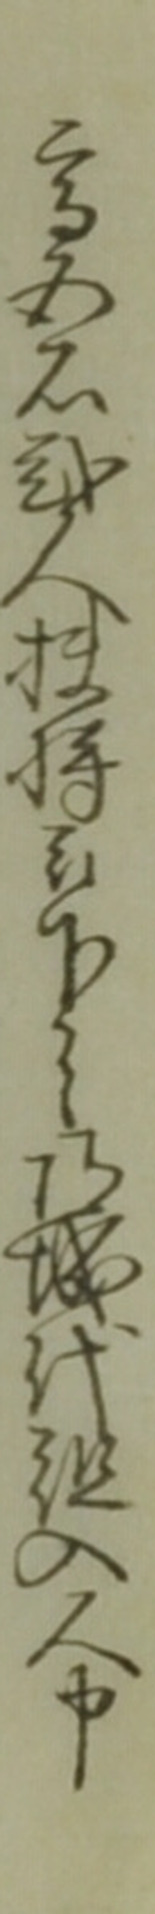高五石弐人扶持被下之御城代組入人中
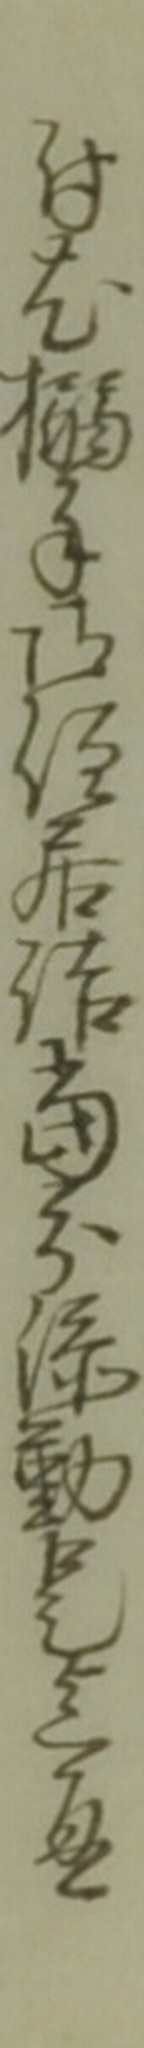付尤搦手御住居詰当分添勤是迄之通
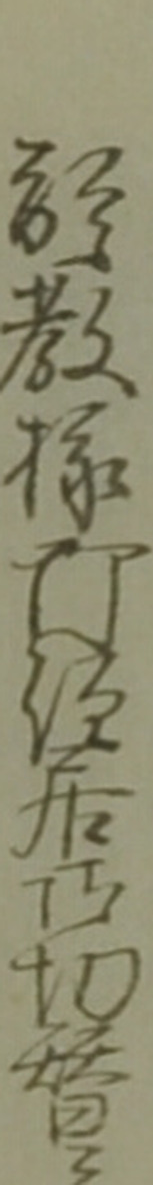於教様御住居御切替
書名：無足諸士勤仕録（七）
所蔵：伊那市立高遠町図書館・合同会社AMANE
